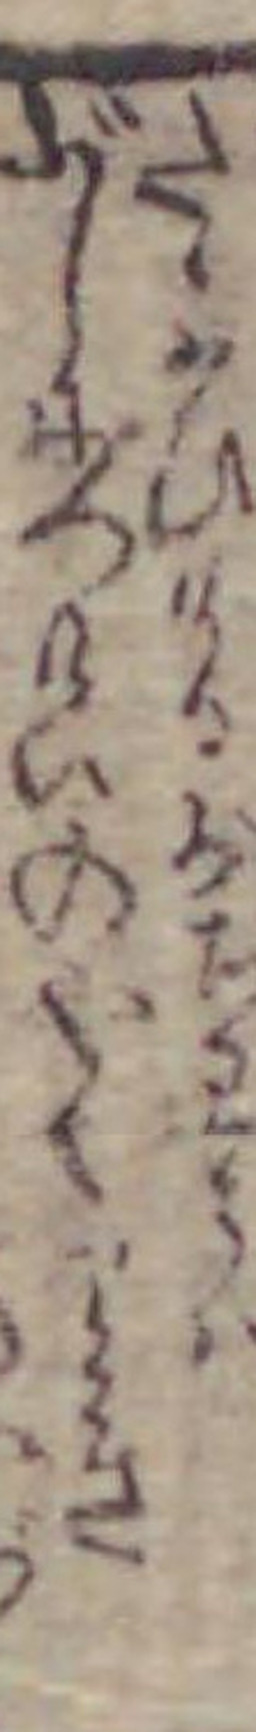ぶしにつけいのやくりき
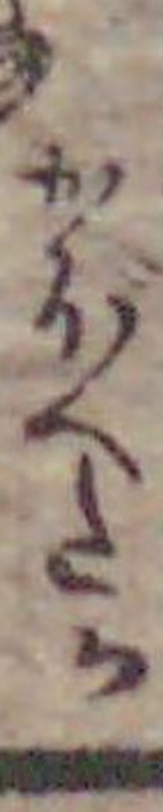おぼへたか
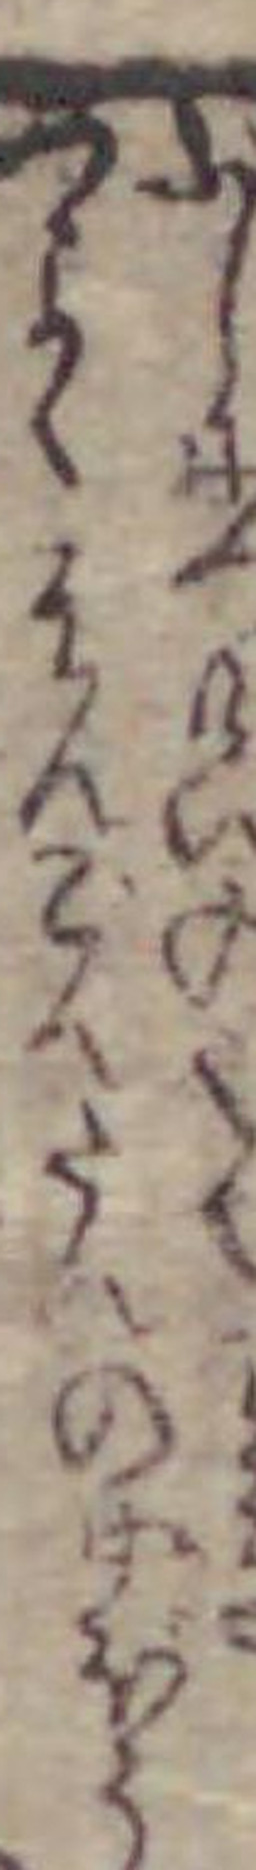つよくはんごんたんの女ぼう
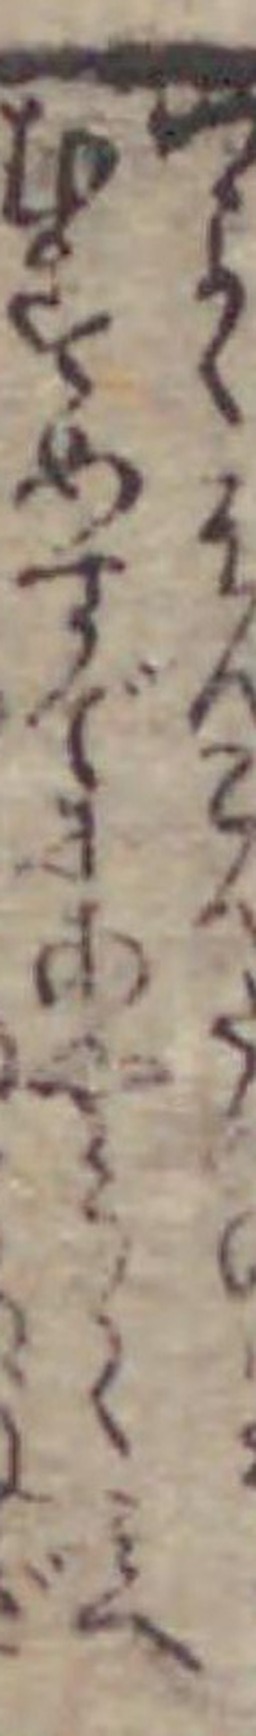むすめすでにあやうくみへ
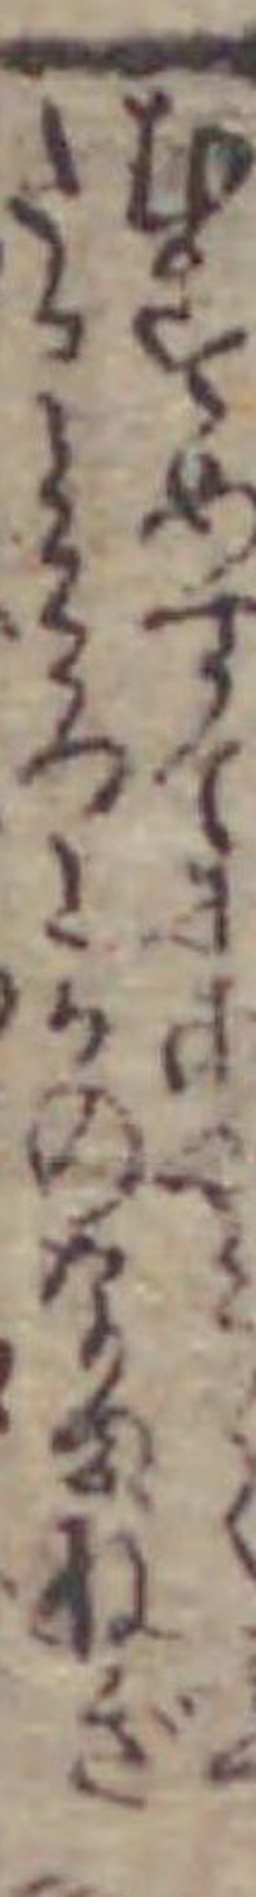たるところとかのなまねぎ
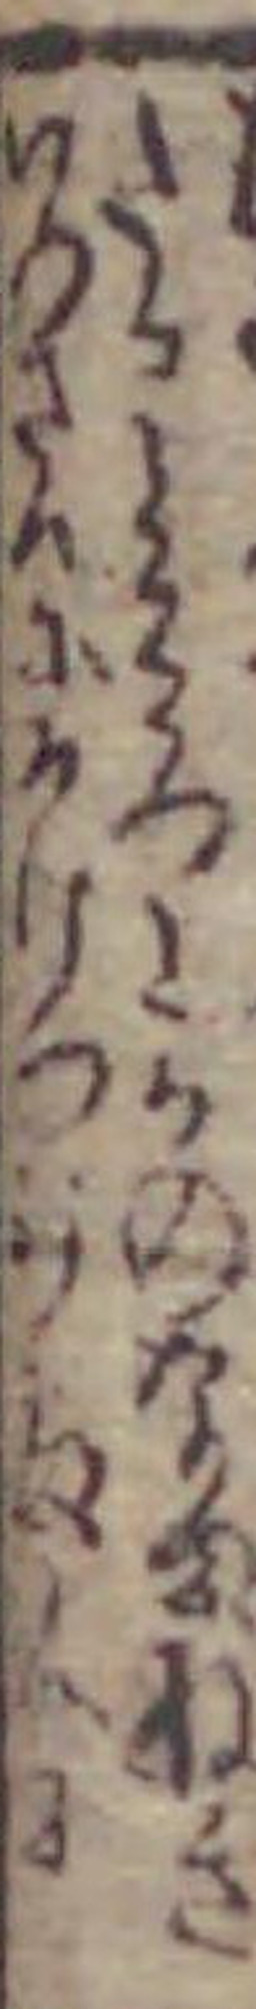いつさんにかけつけ両人に
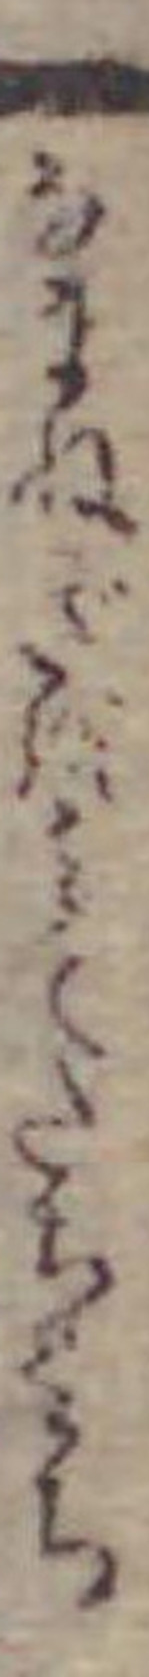なまねぎをみてたちまち
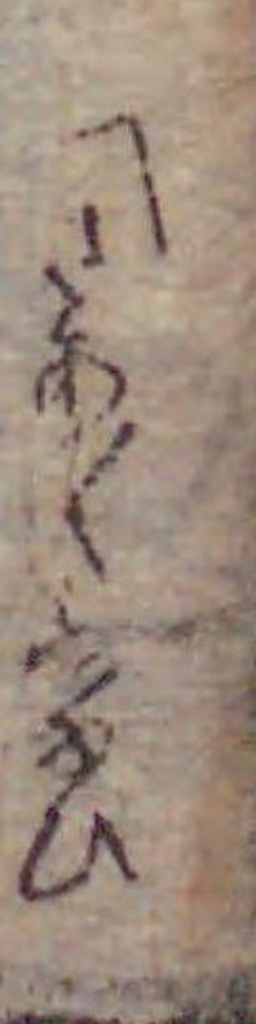〽さあ〳〵しまひ
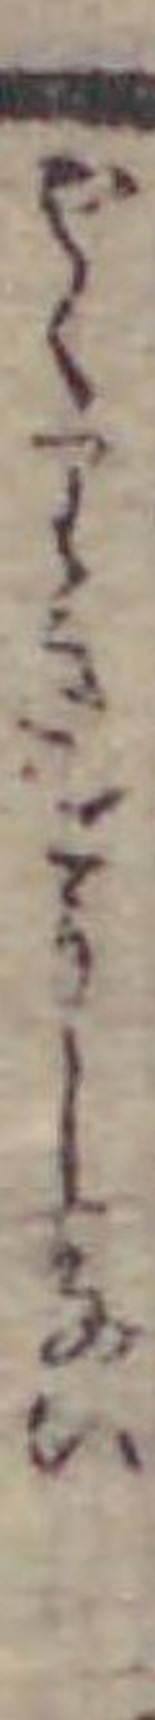やくりきをうしない
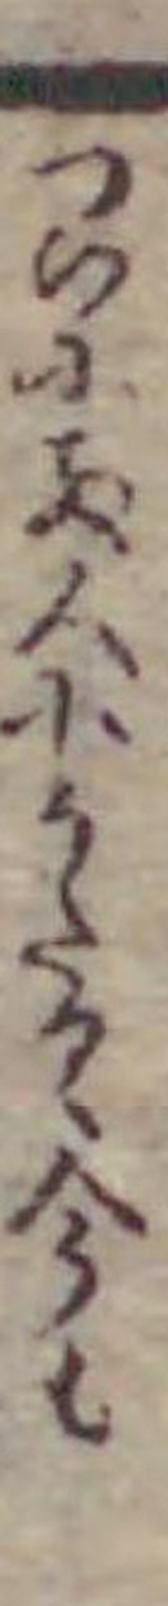ついに両人にうたるゝ今も
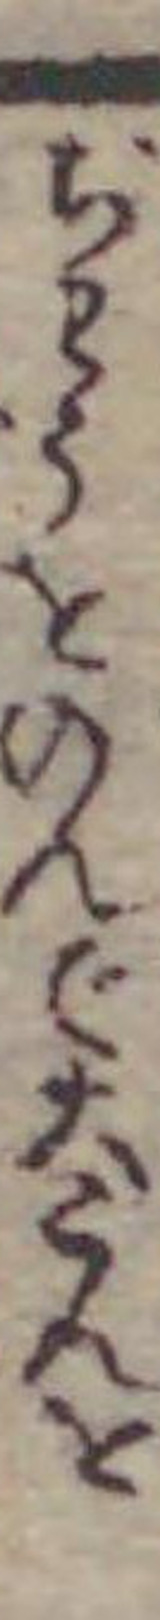ぢわうをのんで大こんを
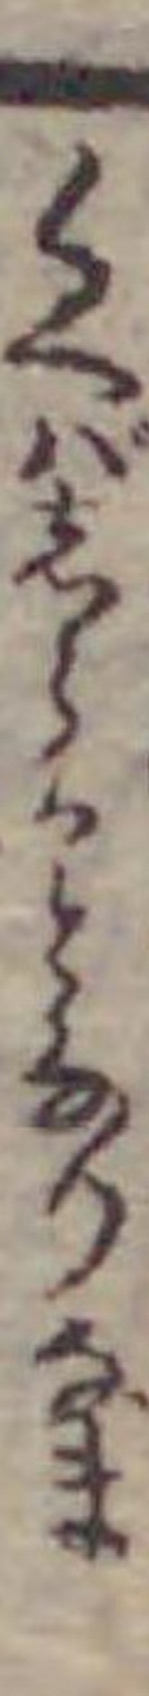くへばしらかとなりなま
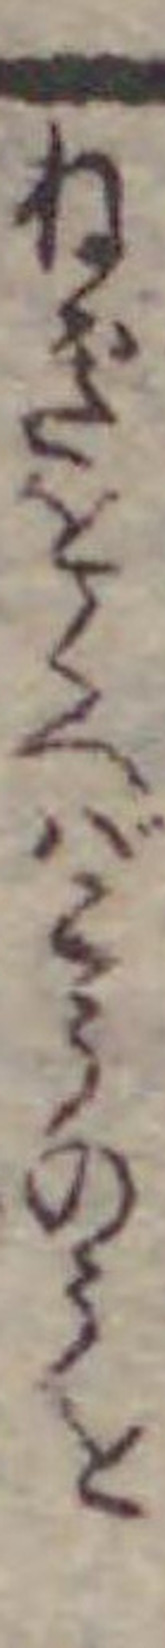ねぎをくへばこうのうを
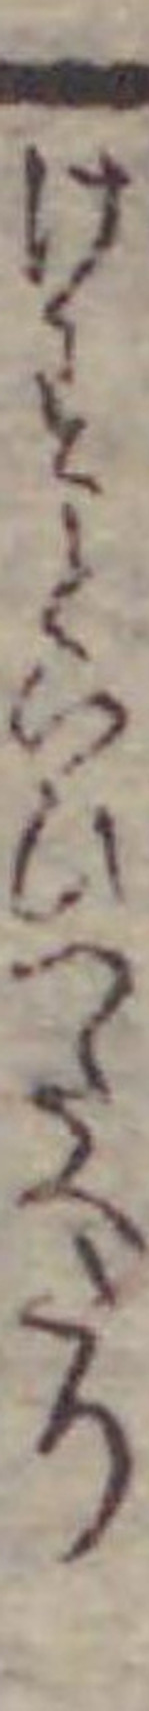けすといひつたへたり
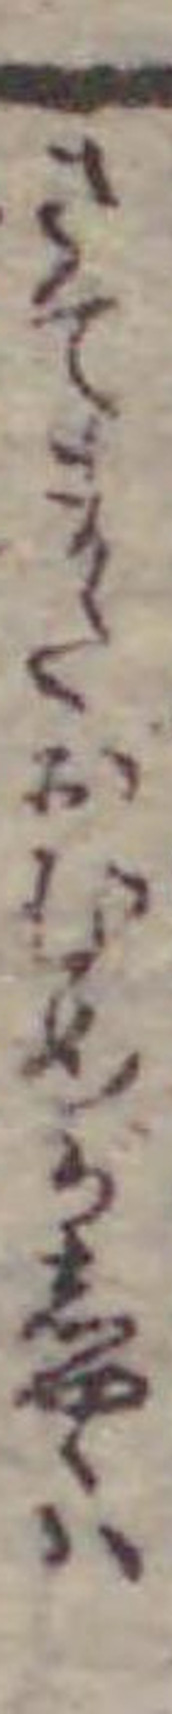さてまたおむめがしやくは
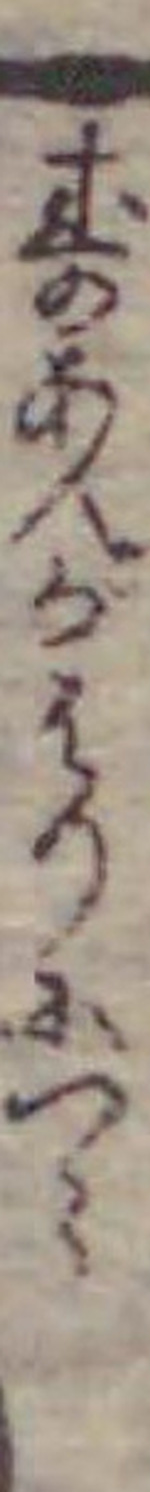寿あんがはりにつゝ
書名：鼻下長生薬 : 3巻
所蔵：国立国会図書館 National Diet Library, JAPAN
